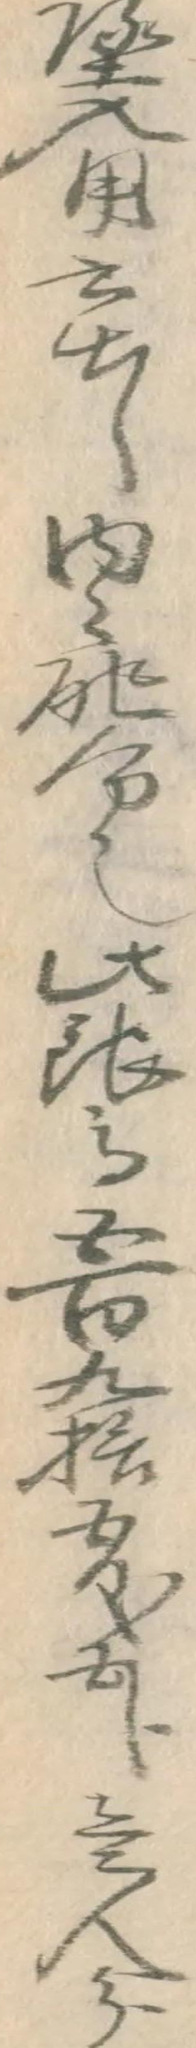墜入用書出し内々配分也此銀高五百九拾五匁五分壱人分

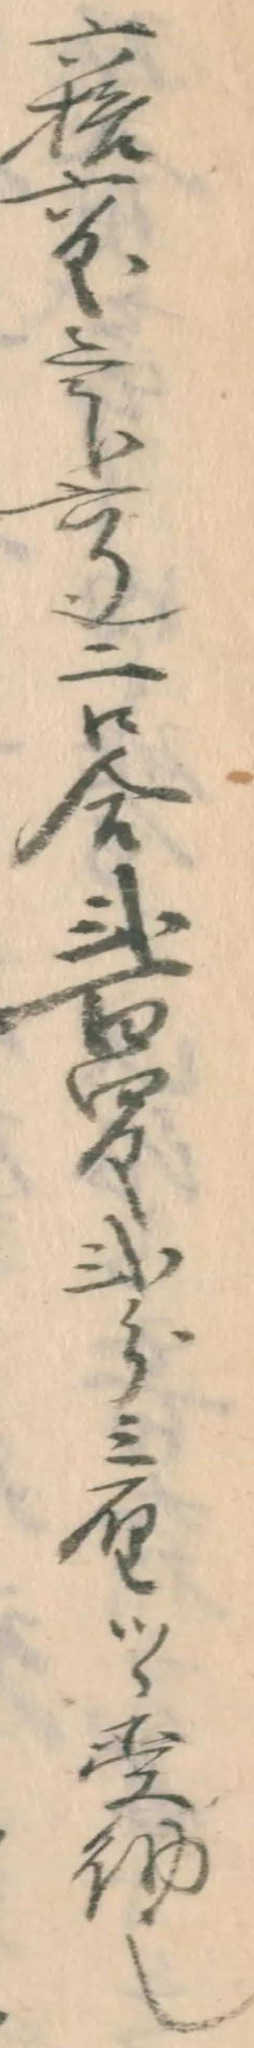六拾六匁壱分六り二口合弐百四匁弐分三厘ツヽ受納也
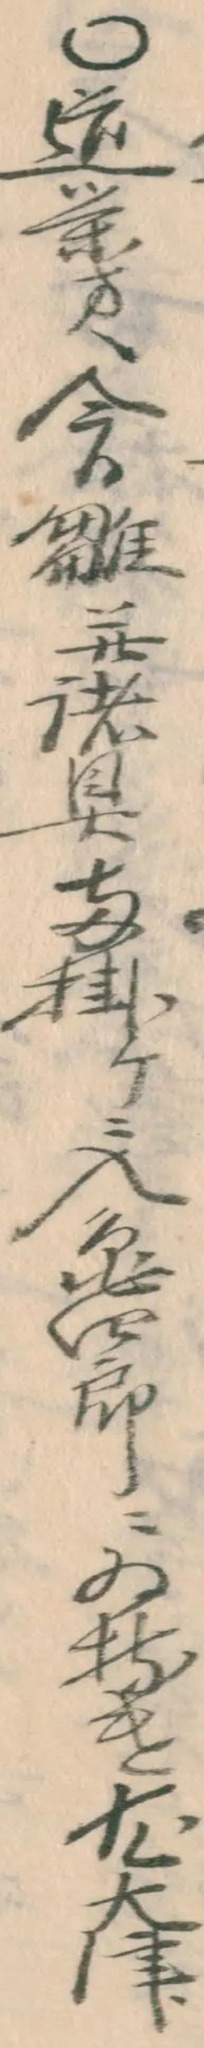○道栄方へ今日雛并諸具両掛ケニ入亀四郎ニ為持遣尤大津
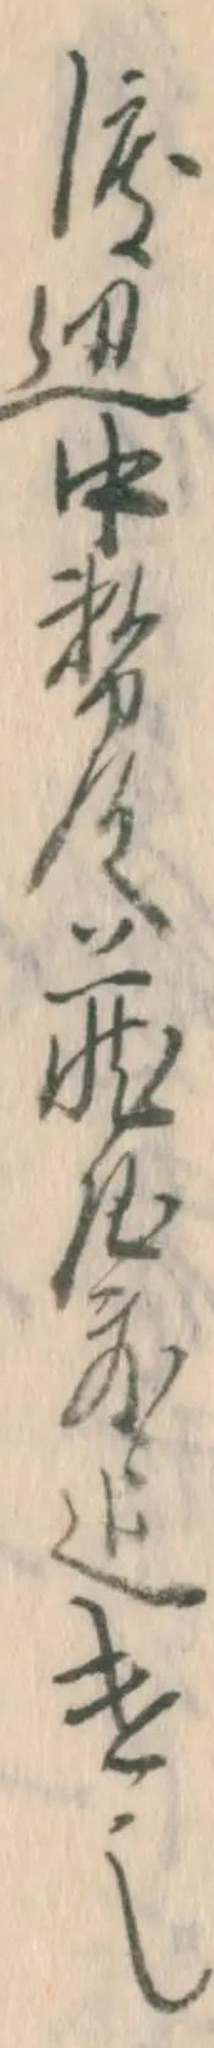渡辺中務殿蔵屋敷迄遣也
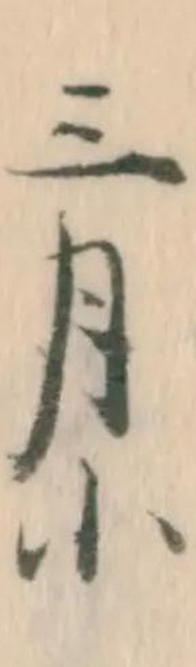三月小
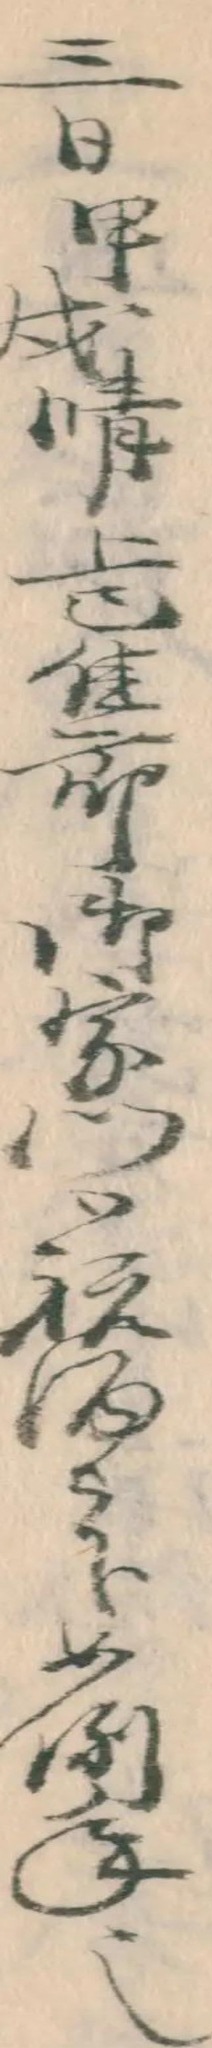三日甲戌晴上巳佳節御家門御祝酒被下如例年也
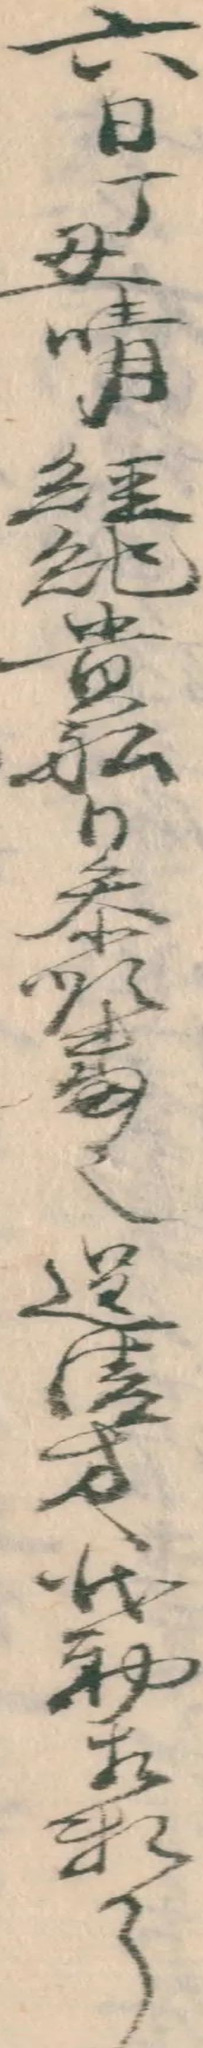六日丁丑晴経紀貴舩日参順番也逞清方へ代勤相頼了
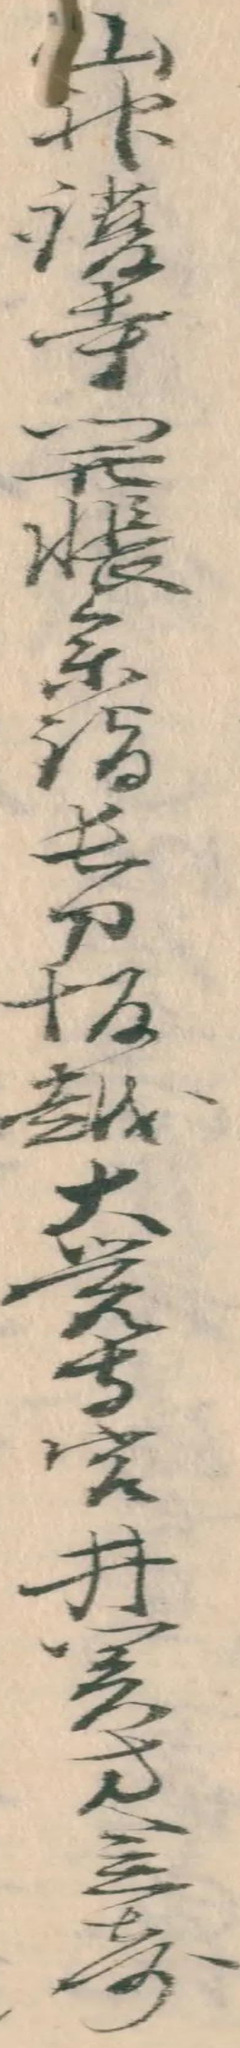山神護寺開帳参詣長刀坂越大覚寺宮井関方へ立寄
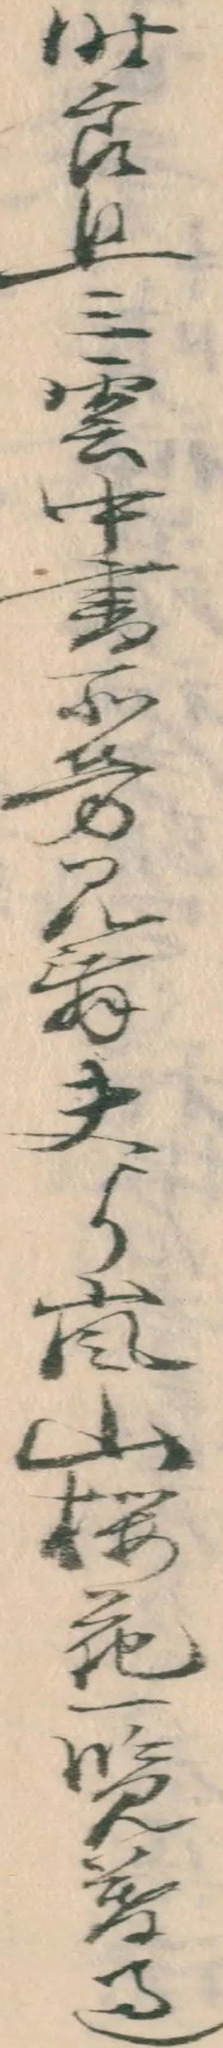時節且三雲中書所労見舞夫より嵐山桜花一覧着過
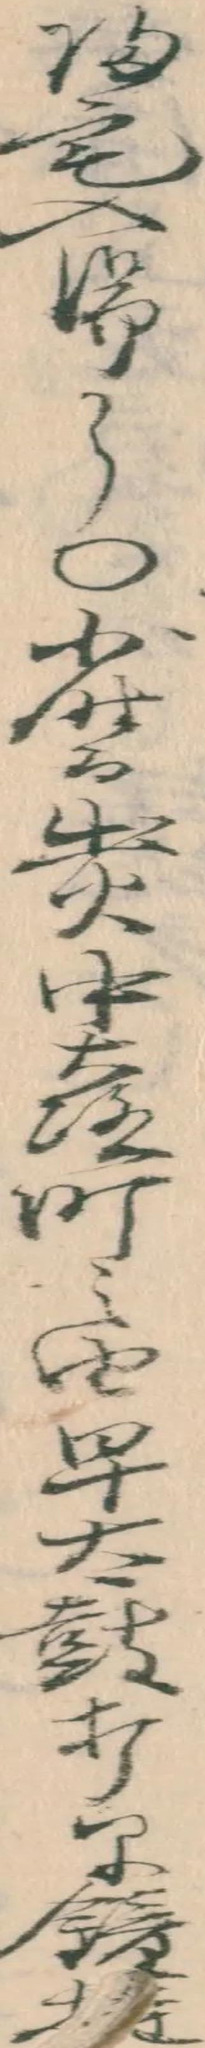帰宅入湯了〇小時而出火中大路町之由早太鼓打早鐘
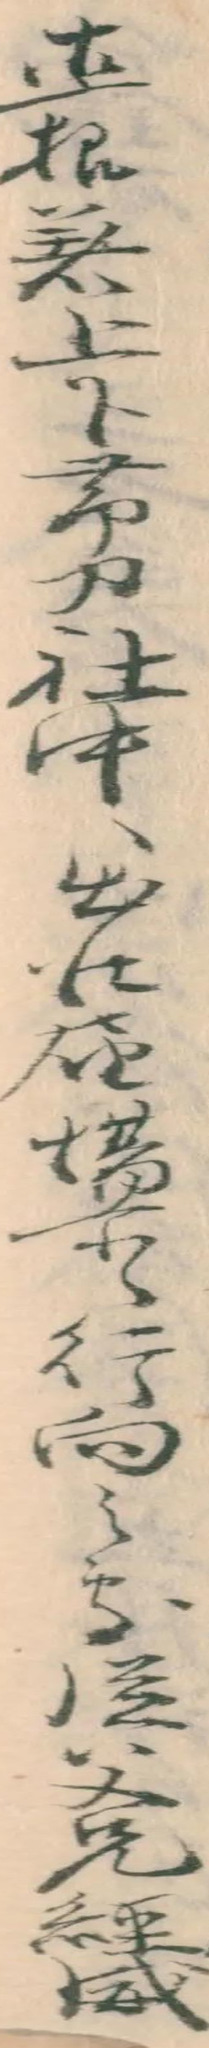直様着上下帯刀社中へ出仕届場所へ行向之處従父兄経威
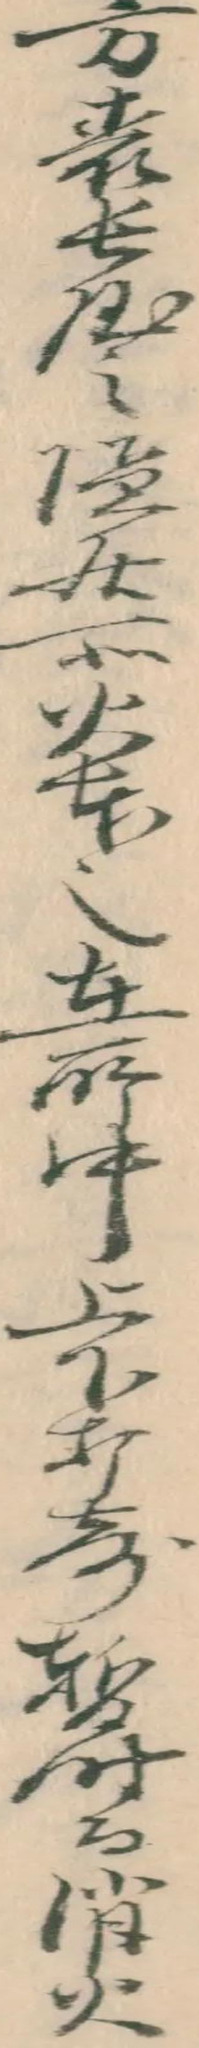方表長屋之隠居所火本也在所中上下打寄暫時而消火
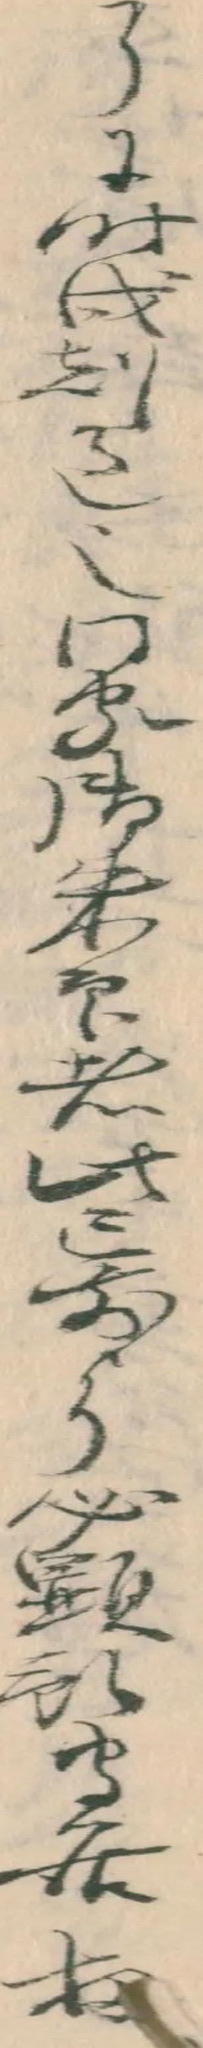了に時戌刻過也同家御朱印者此已前より必顕預守居扨
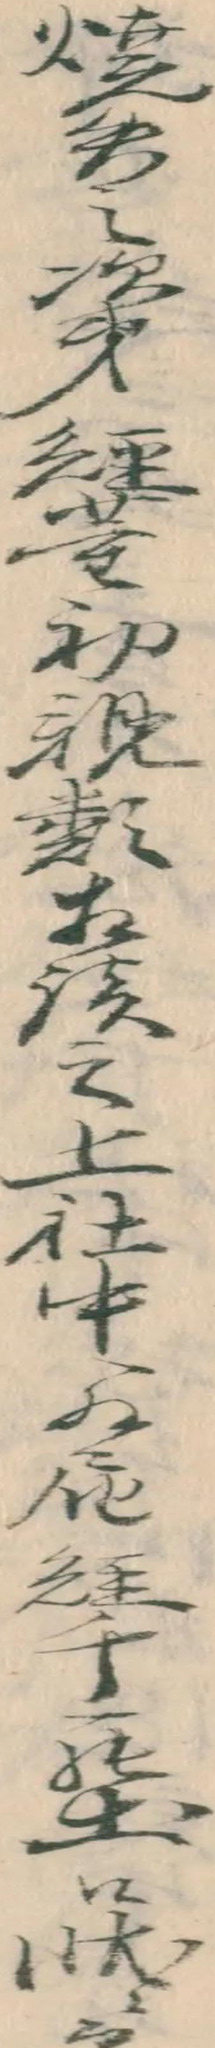焼失之次経董初親類相談之上社中へ為届経千罷出候状ニ而
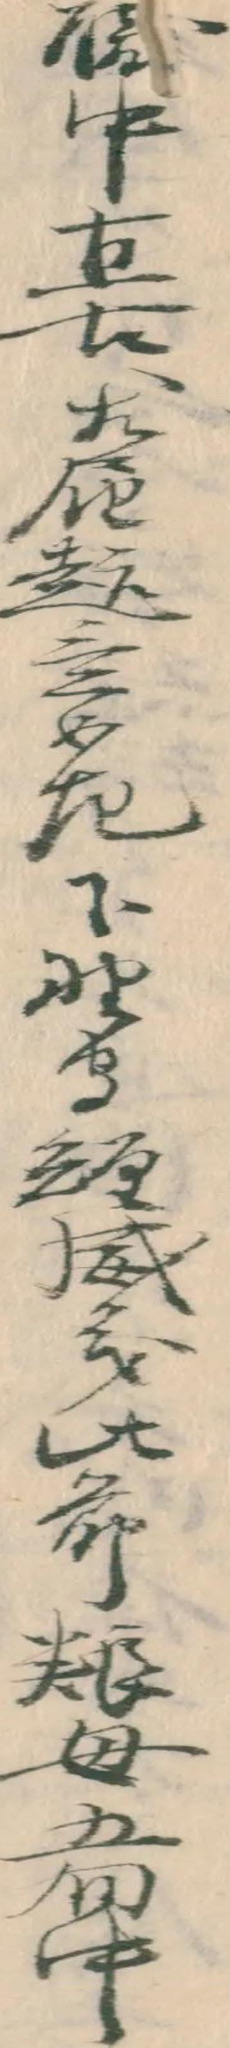職中直古へ相届趣意如左下野守経威義此節養母五旬中
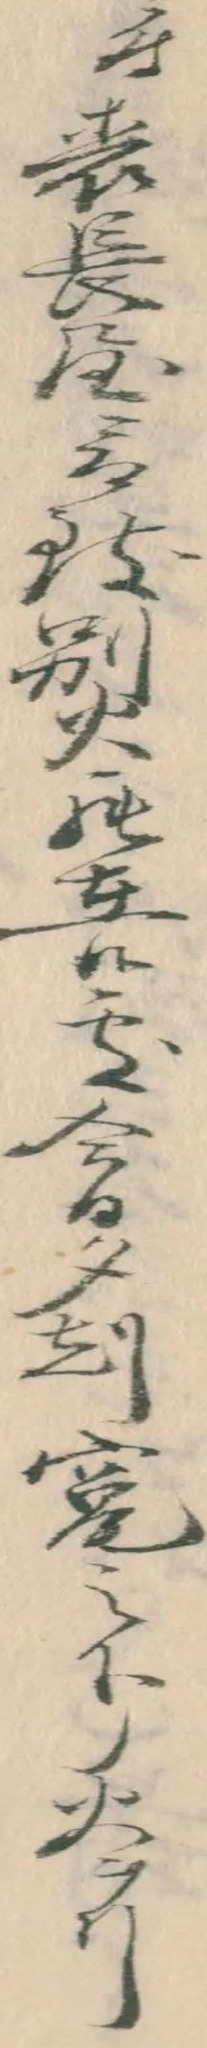ニ付表長屋ニ而致別火罷在候處今日夕刻寛之下火ヲ引
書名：賀茂社記録. 第66冊
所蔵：国立国会図書館 National Diet Library, JAPAN
